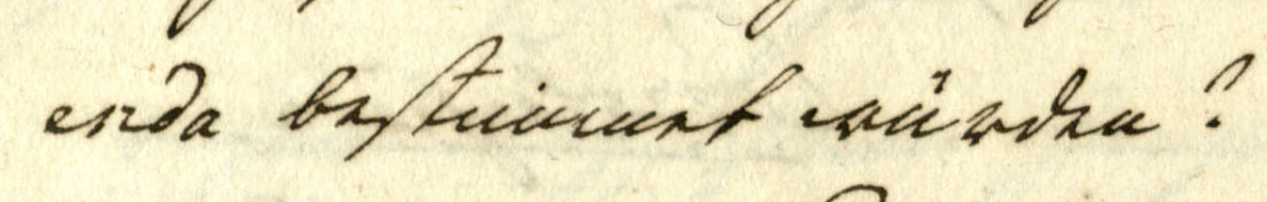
enda bestimmet würden?
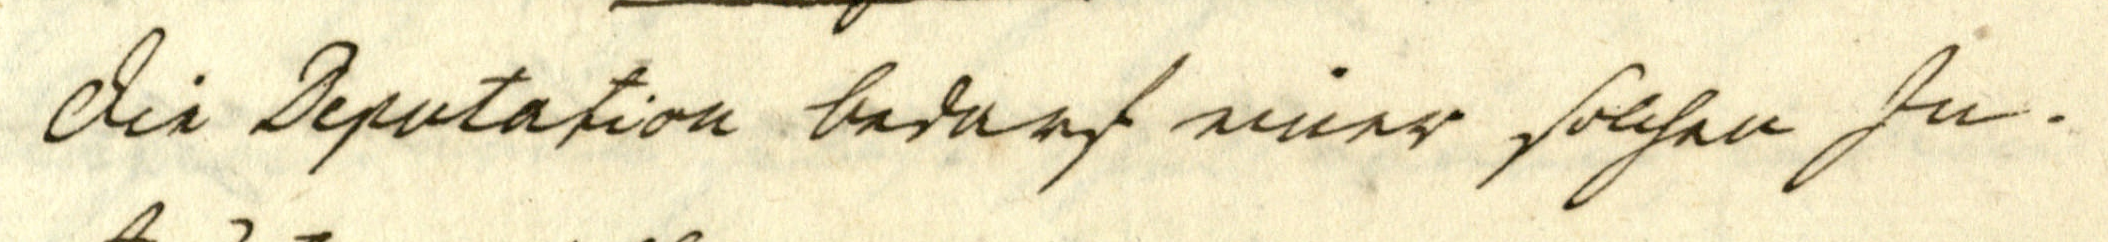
Die Deputation bedarf einer solchen In¬
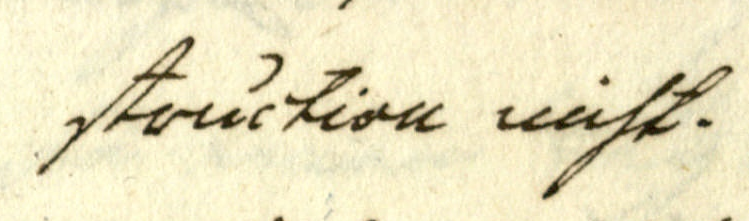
struction nicht.
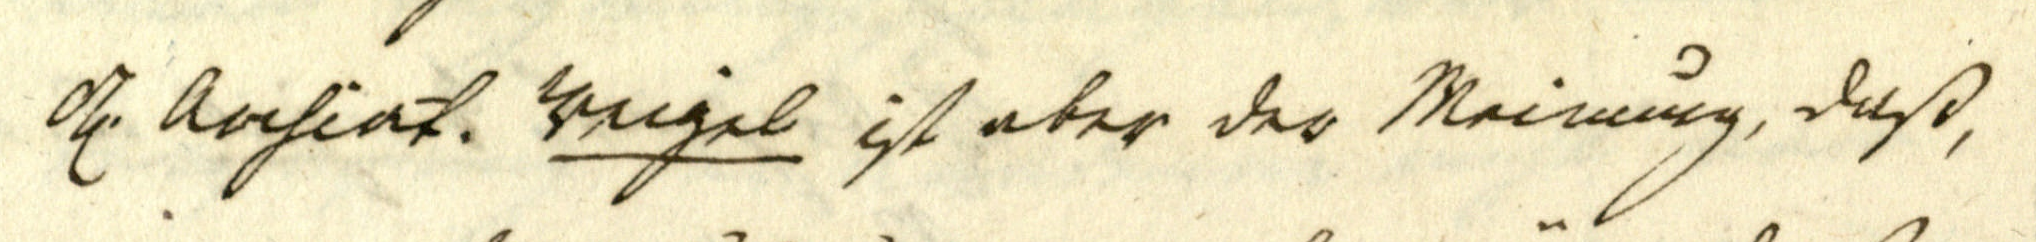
dh. Archiat. Weigel ist aber der Meinung, daß,
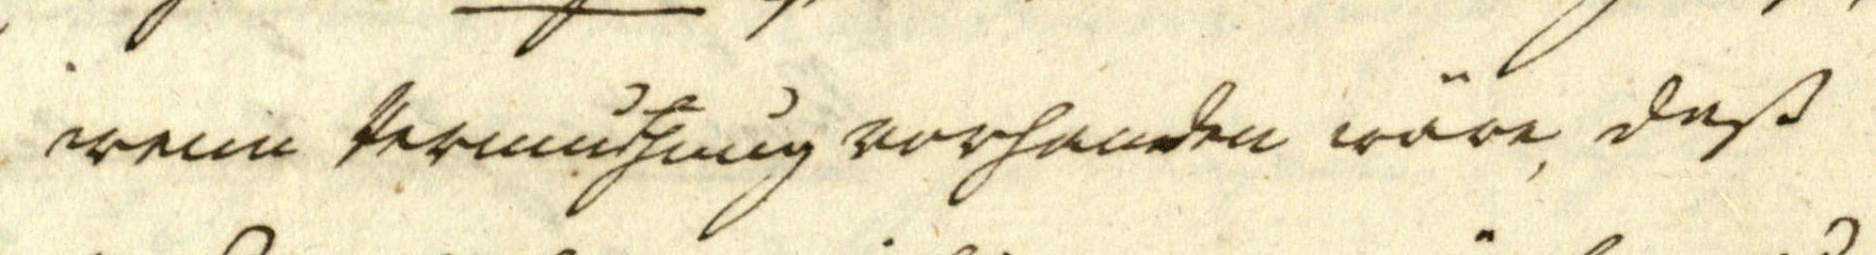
wenn Vermuthung vorhanden wäre, daß
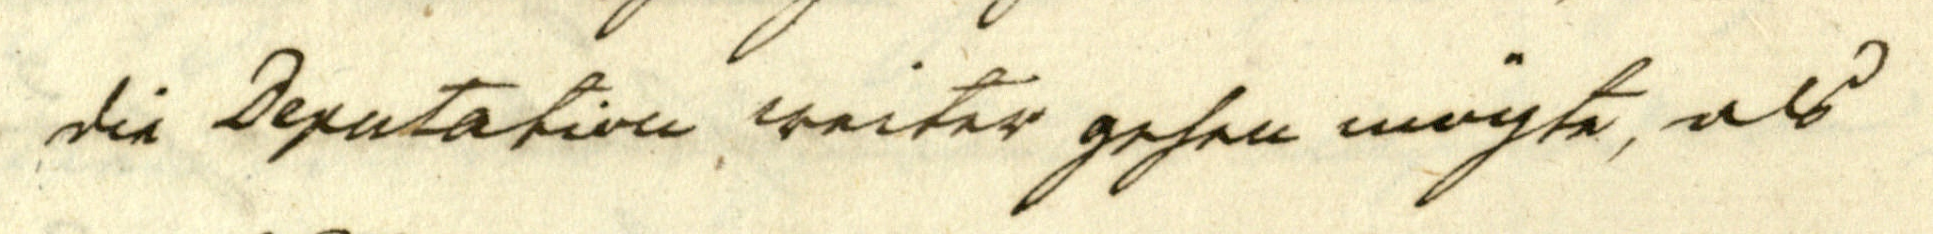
die Deputation weiter gehen mögte, als
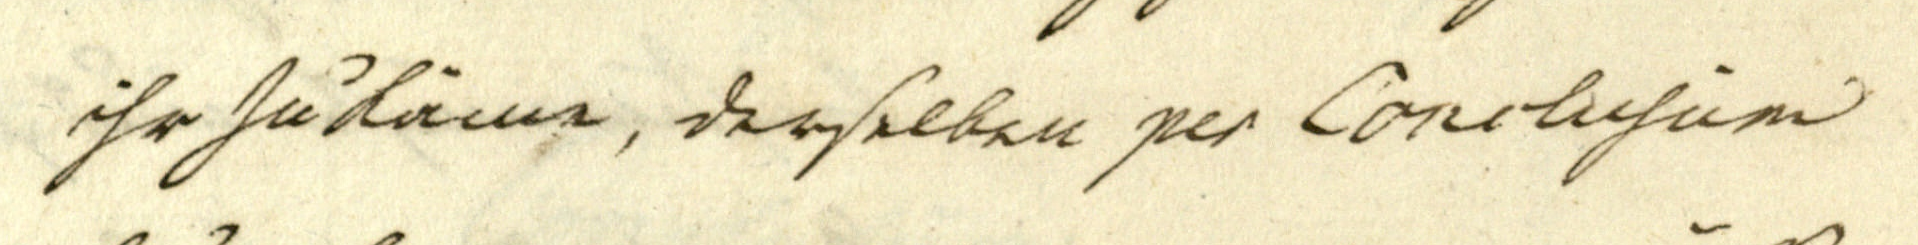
ihr zukäme, derselben per Conclusum
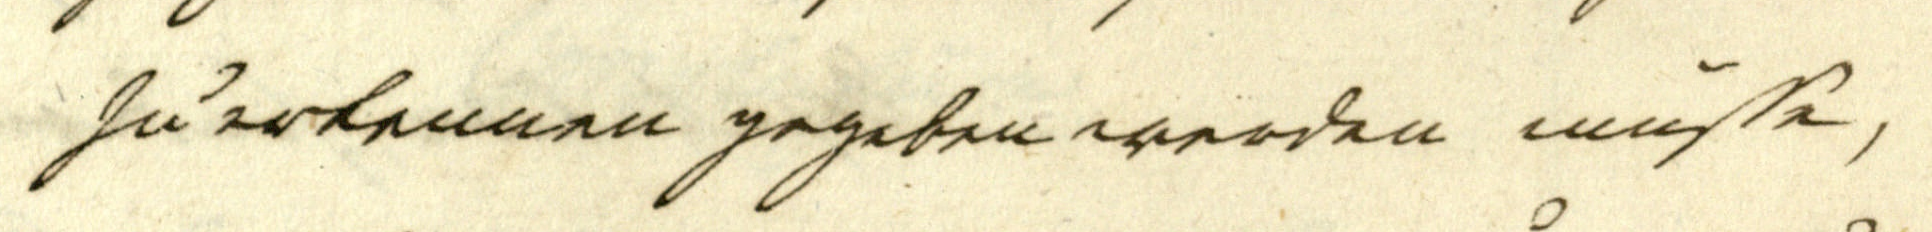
zu erkennen gegeben werden müsse,
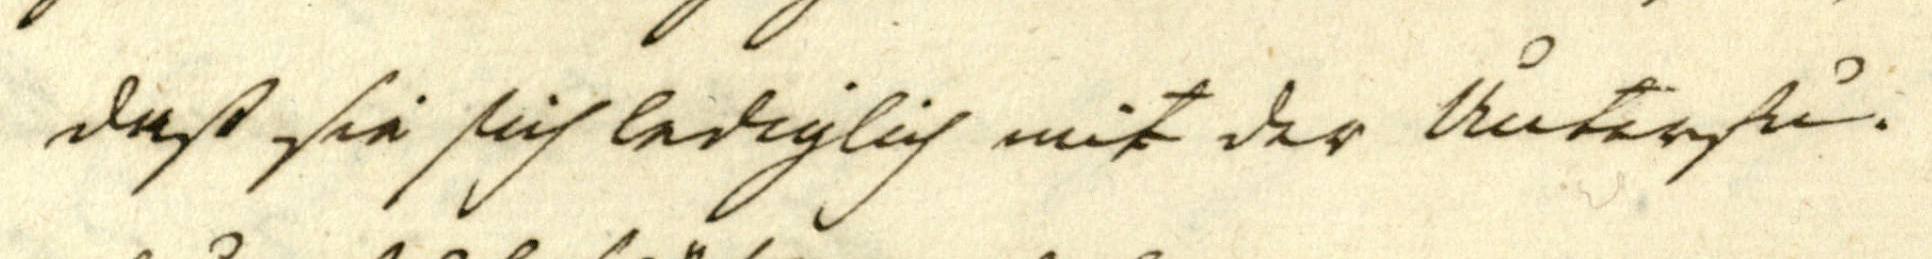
daß sie sich lediglich mit der Untersu¬
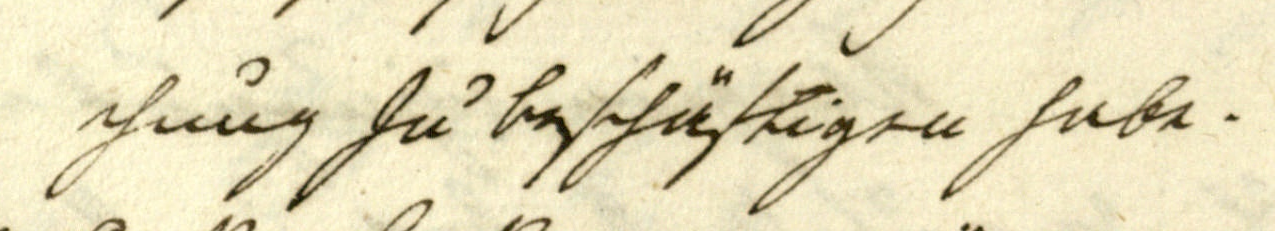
chung zu beschäftigen habe.
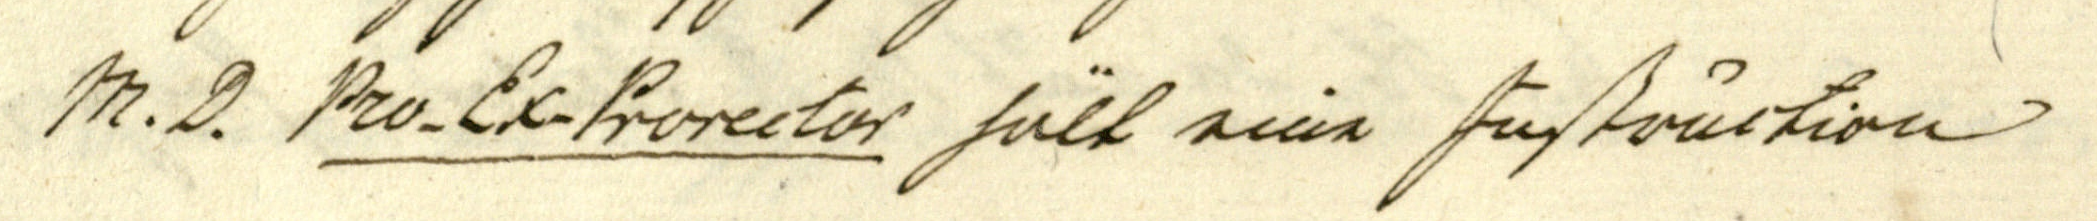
M. D. Pro. ExProrector hält eine Instruction
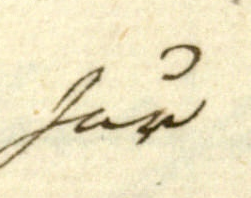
zur
